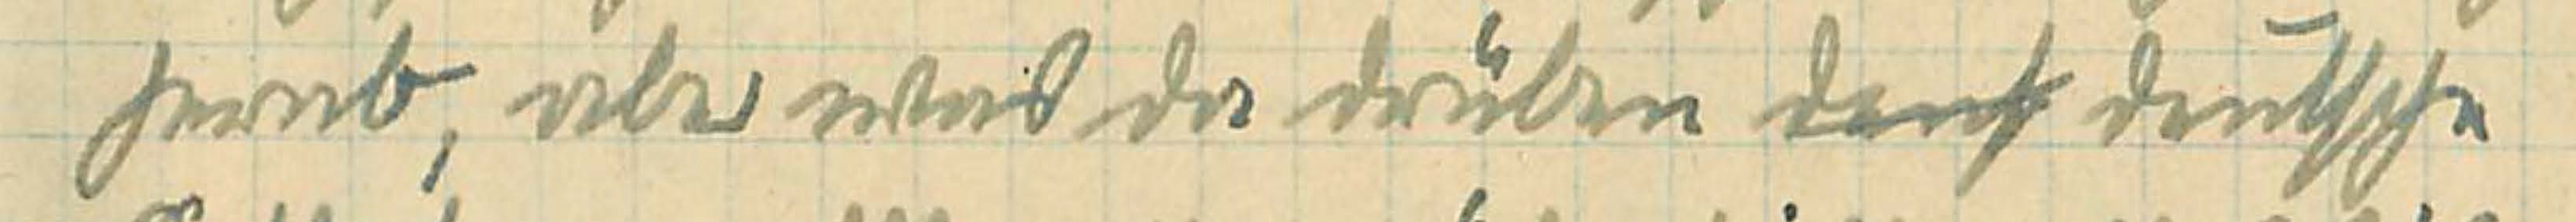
herab, aber was da drüben deus deutsche
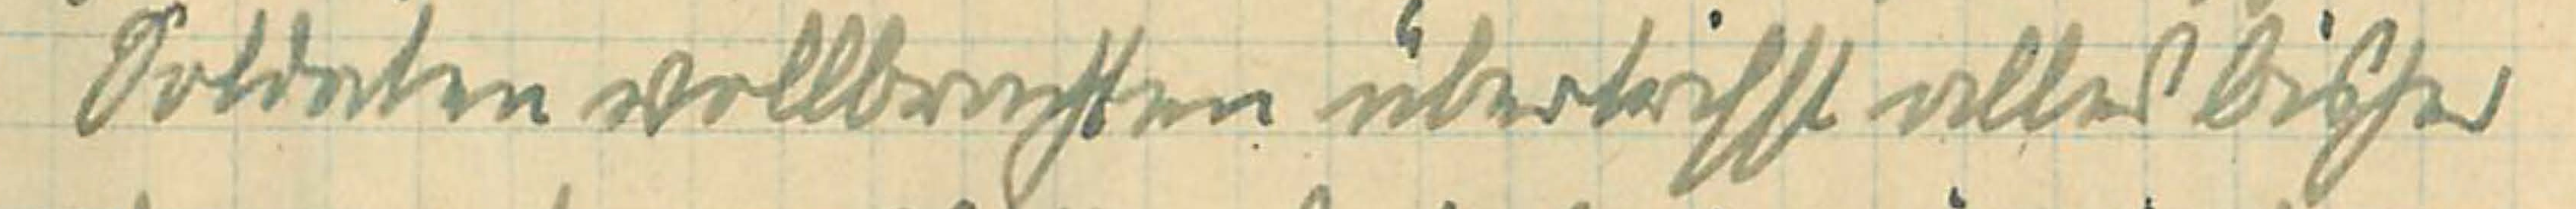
Soldaten vollbrachten übertrifft alles bisher
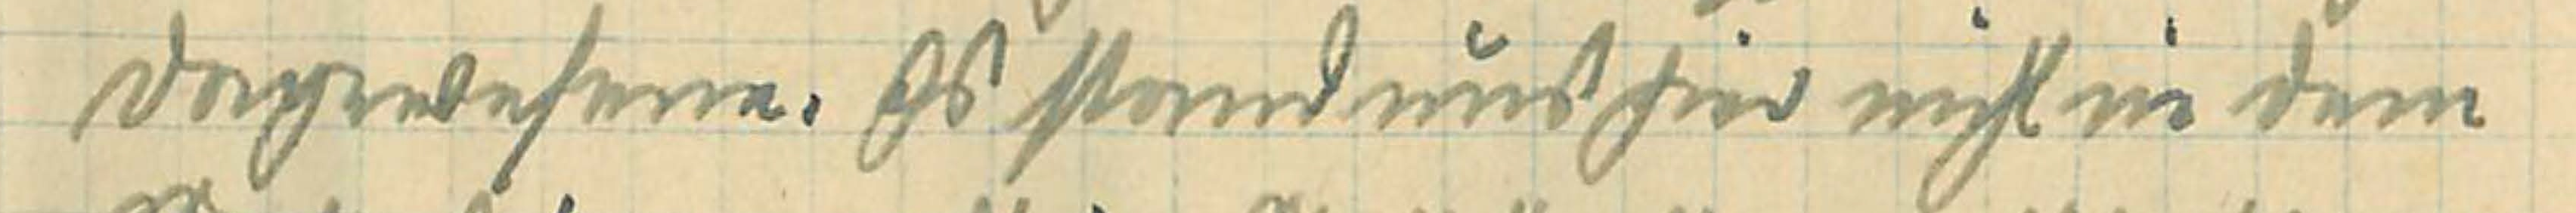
dagewesene. Es stand uns hier nicht in dem
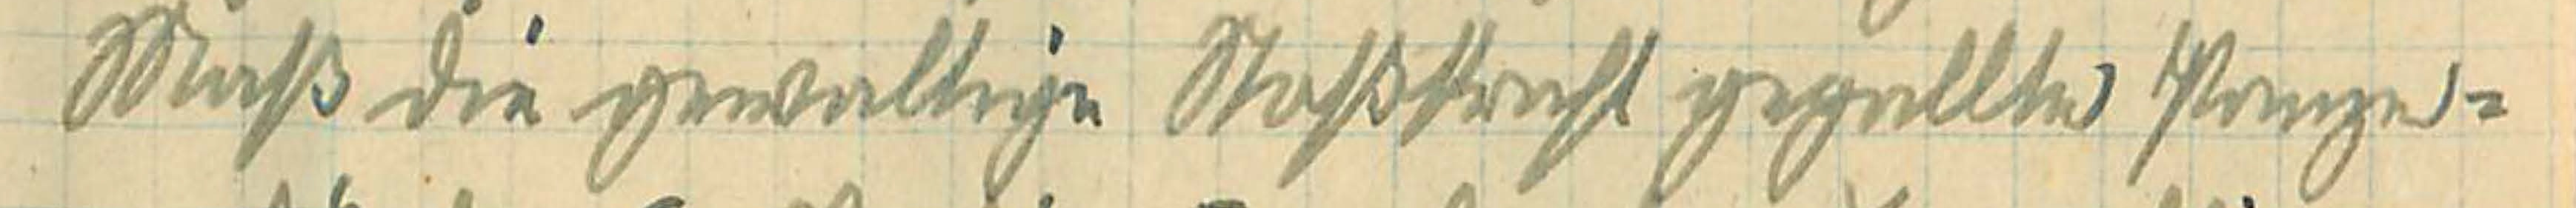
Maß die gewaltige Stoßkraft gepallter Panzer-
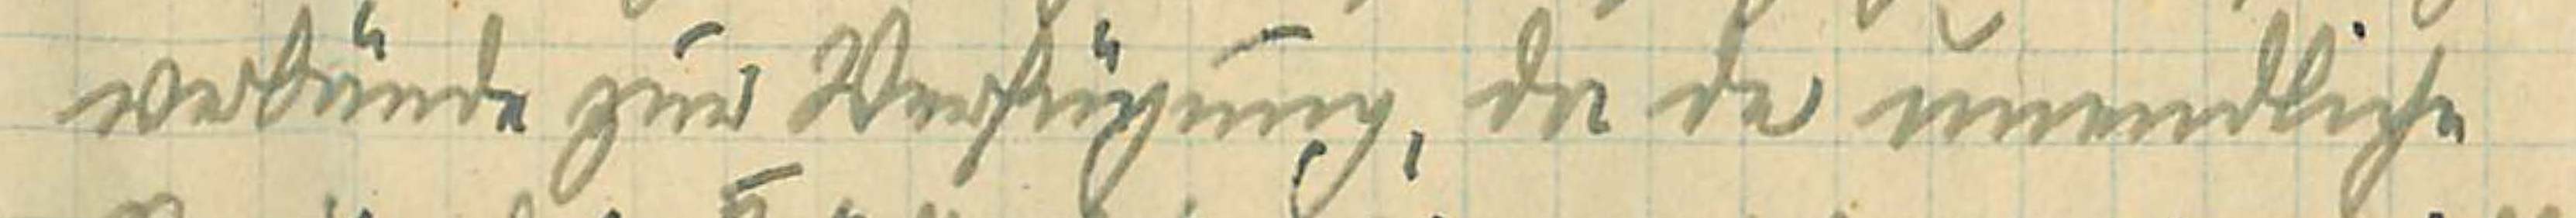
verbände zur Verfügung, da der unendliche
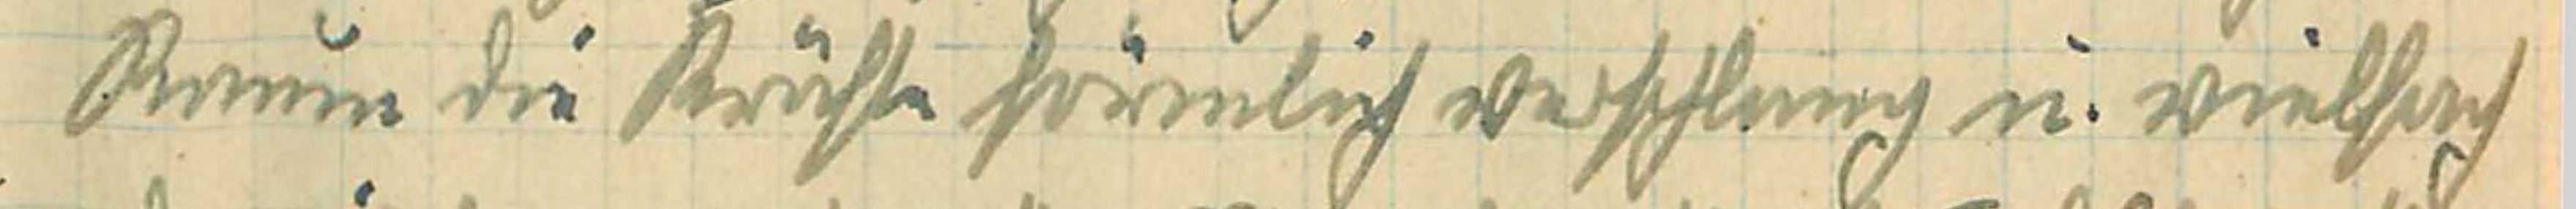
Raum die Kräfte förmlich verschlang u. vielfach
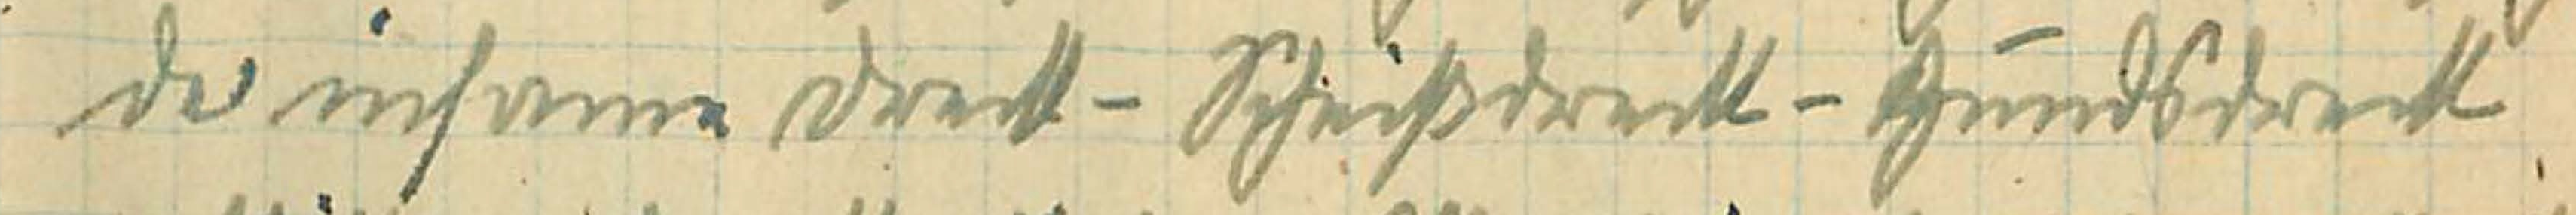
der infame Dreck - Scheißdreck - Hundsdreck
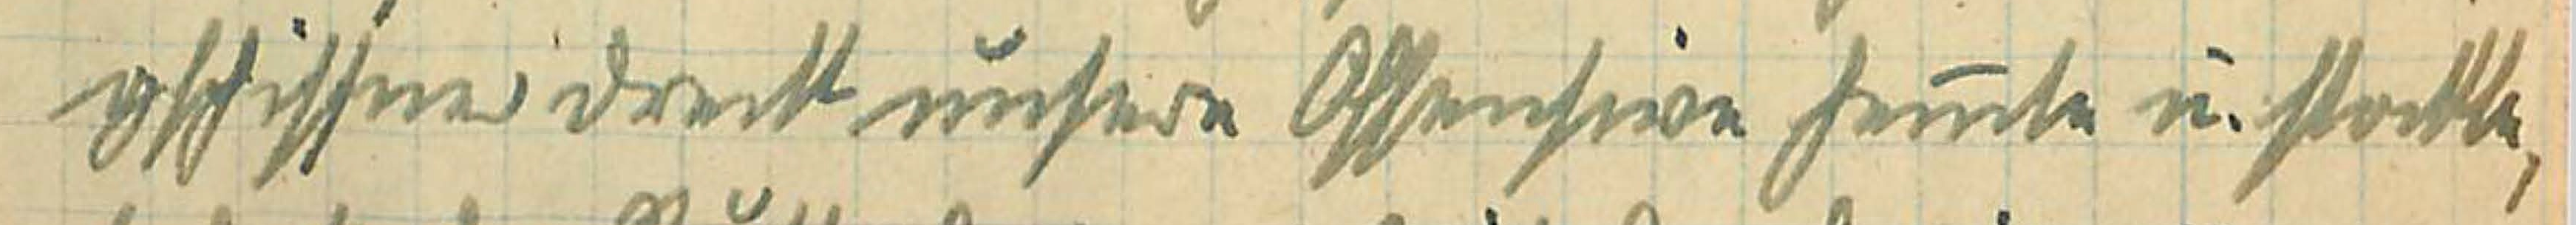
gschissner Dreck unsere Offensive hemmte u. stockte,
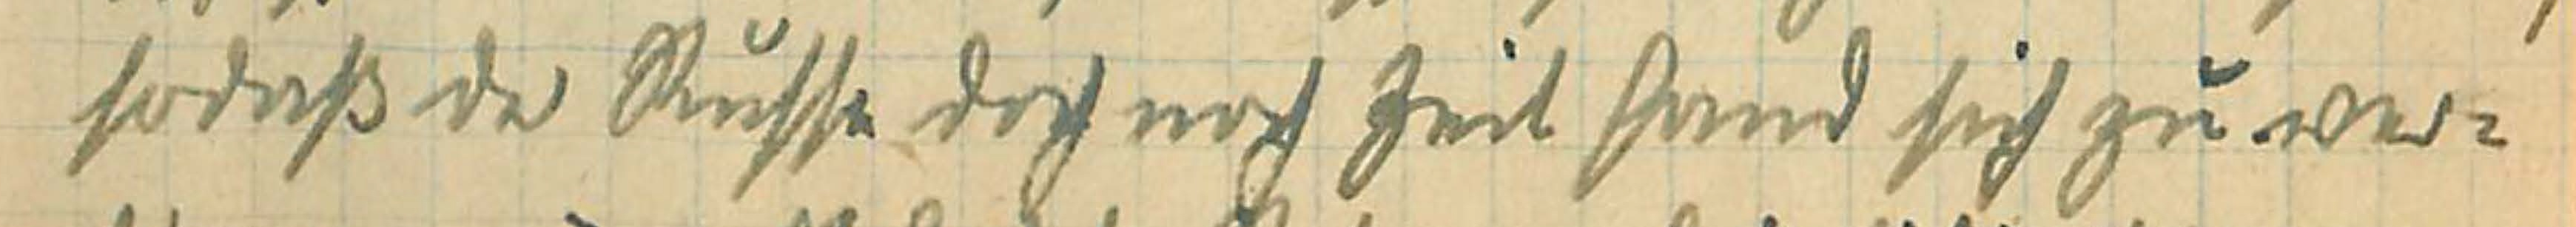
sodaß der Russe doch noch Zeit fand sich zu ver-
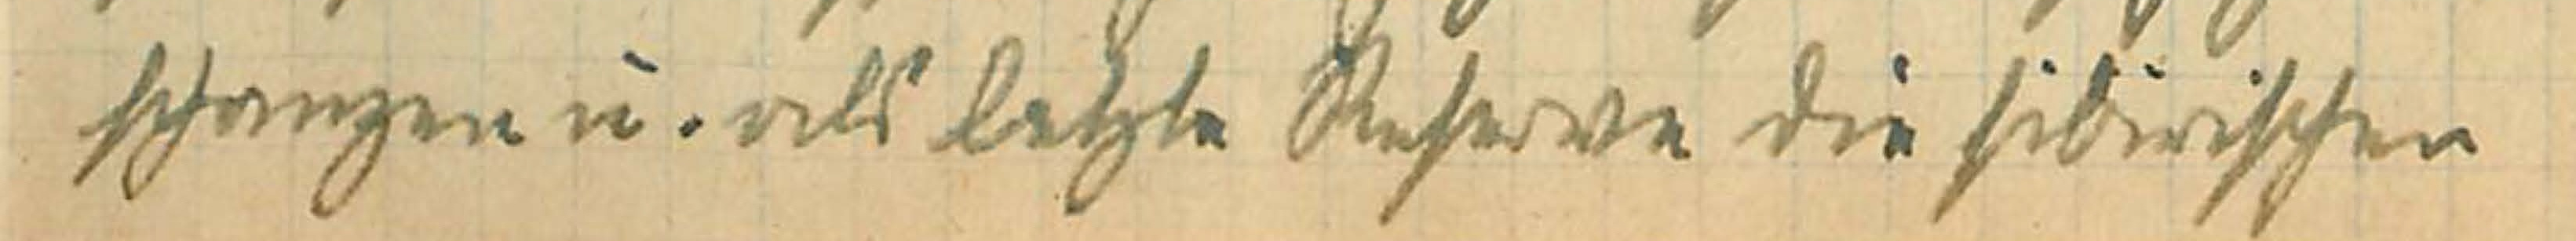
schanzen u. als letzte Reserve die sibirischen
